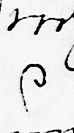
d
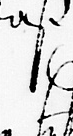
2.
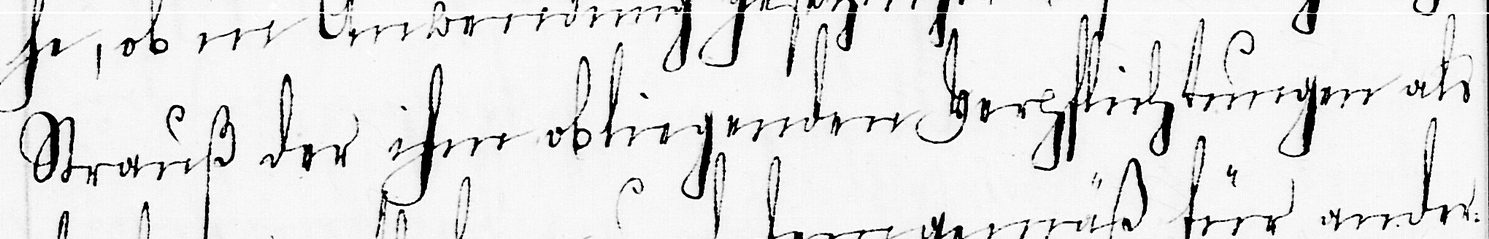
Strauß der ihm obliegenden Verpflichtungen als
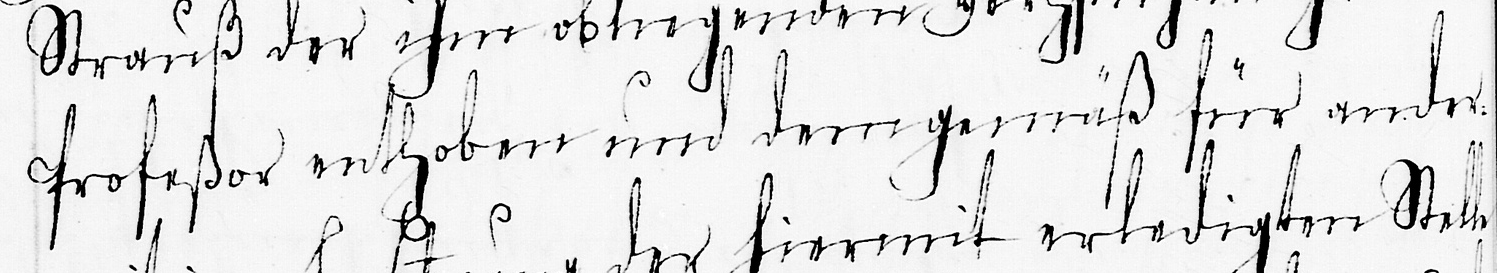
Profeßor enthoben und demgemäß für ander¬
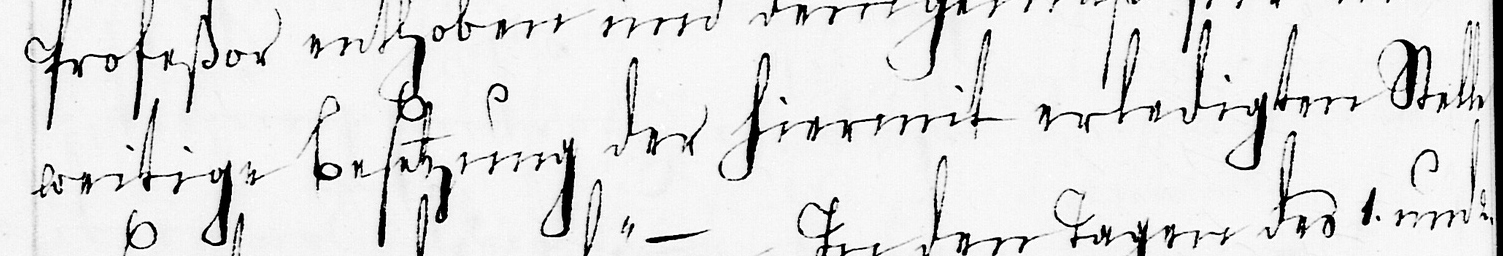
weitige Besetzung der hiermit erledigten Stel¬
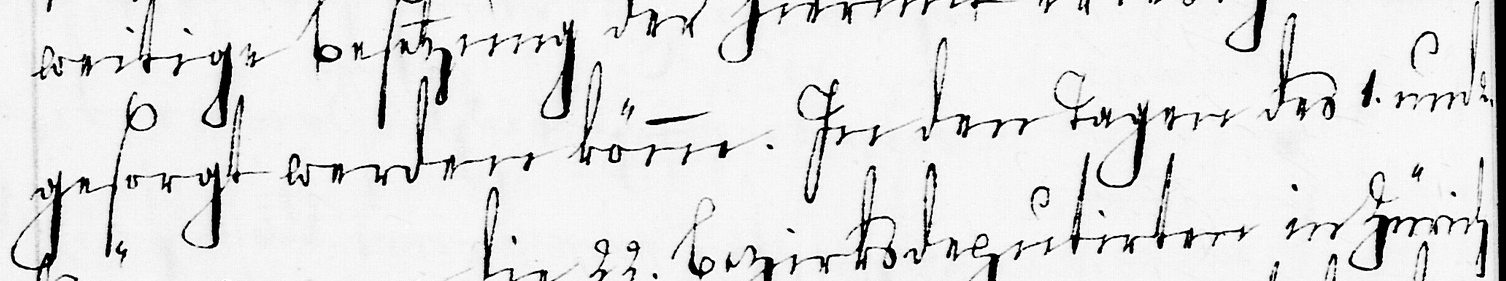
gesorgt werden könne. In den Tagen des 1. un¬
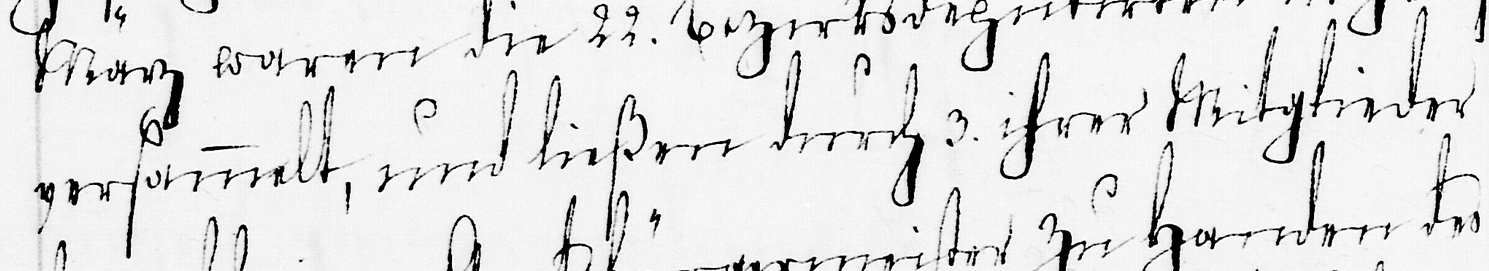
versammelt, und ließen durch 3. ihrer Mitglieder
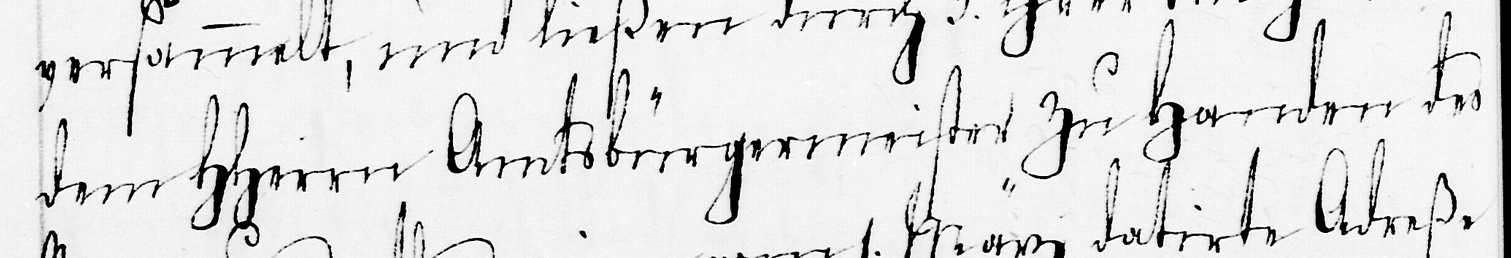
dem HHerrn Amtsbürgermeister zu Handen des
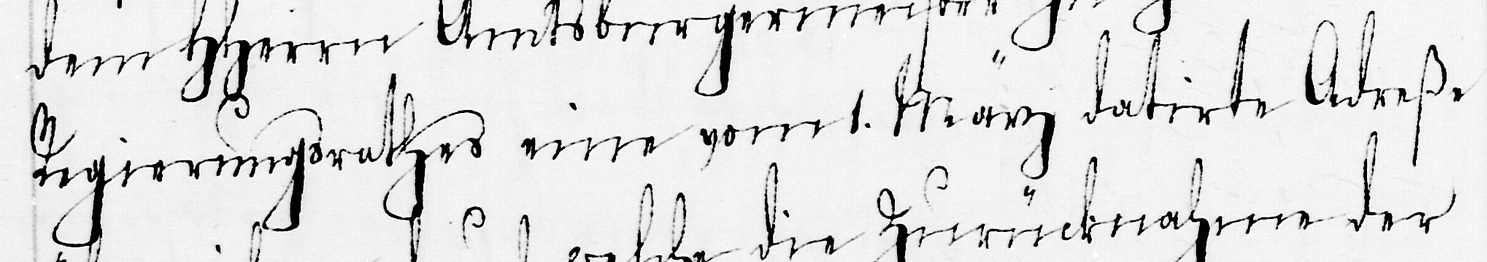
Regierungsrathes eine vom 1. März datirte Adreße
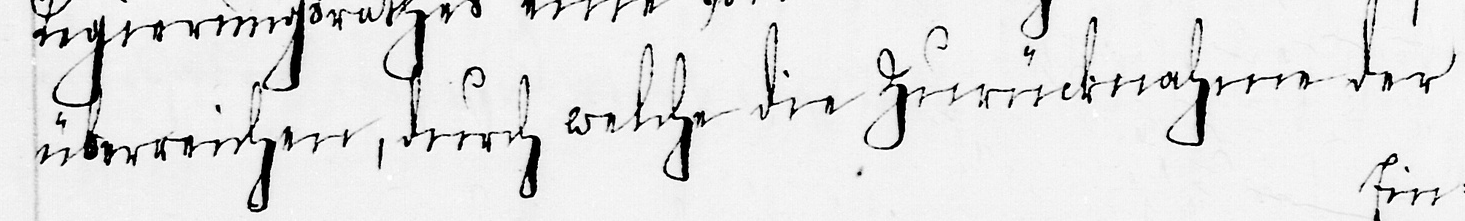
überreichen, durch welche die Zurücknahme der
